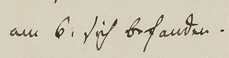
am 6. sich befanden.
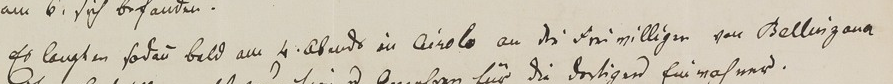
Es langten sodann bald am 4. Abends in Airolo an die Freiwilligen von Bellinzona
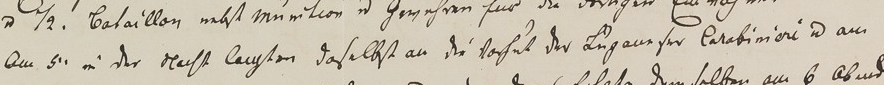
Am 5t in der Nacht langten daselbst an die Vorhut der Luganeser Carabinieri u am
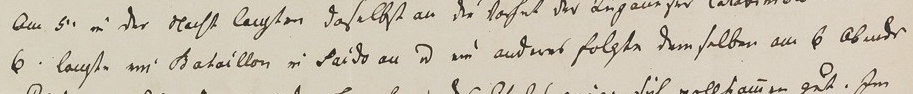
6. langte ein Bataillon in Faido an u ein anderes folgte dem selben am 6 Abends
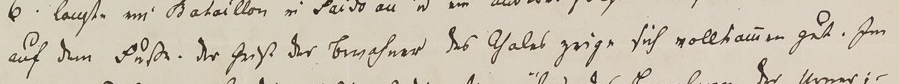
auf dem Fuße. Der Geist der Bewohner des Thales zeige sich vollkommen gut. Im
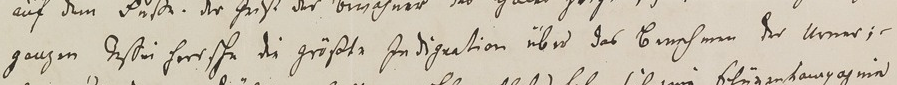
ganzen Tessin herrsche die größte Indignation über das Benehmen der Urner; –
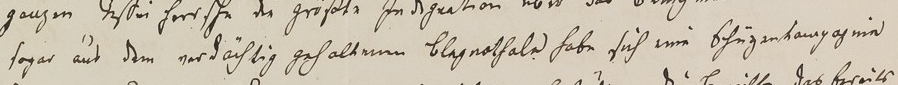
sogar aus dem verdächtig gehaltenen Blegnothale habe sich eine Schüzenkompagnie
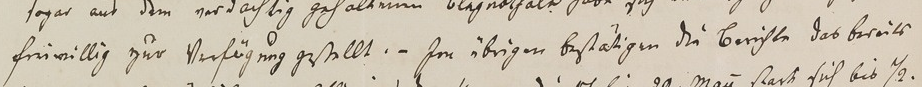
freiwillig zur Verfügung gestellt. – Im übrigen bestätigen die Berichte das bereits
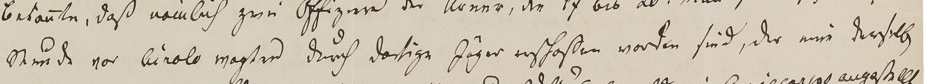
Stunde vor Airolo wagten durch dortige Jäger erschossen worden sind, der eine derselben
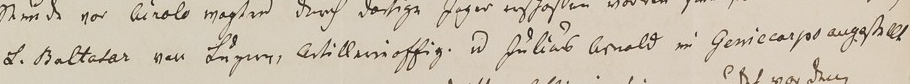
L. Baltasar von Luzern, Artillerieoffiz. u Julius Arnold im Geniecorps angestellt
